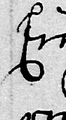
4.)
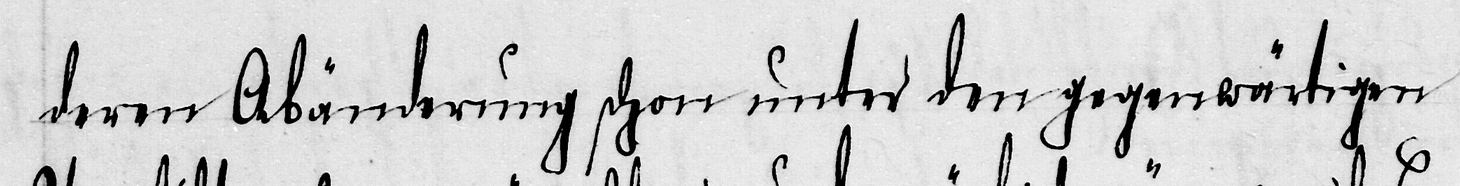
deren Abänderung schon unter den gegenwärtigen
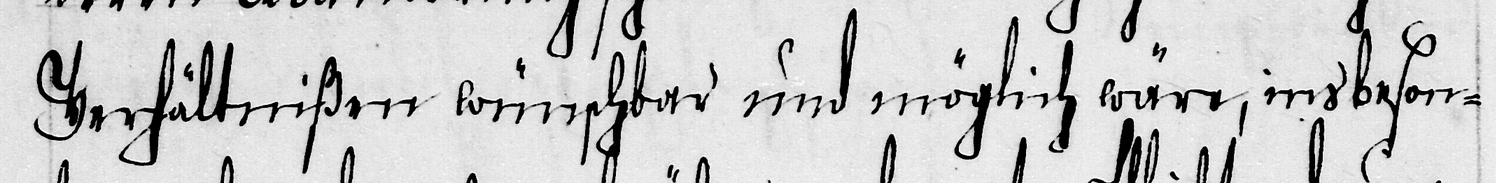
Verhältnißen wünschbar und möglich wäre, insbeson¬
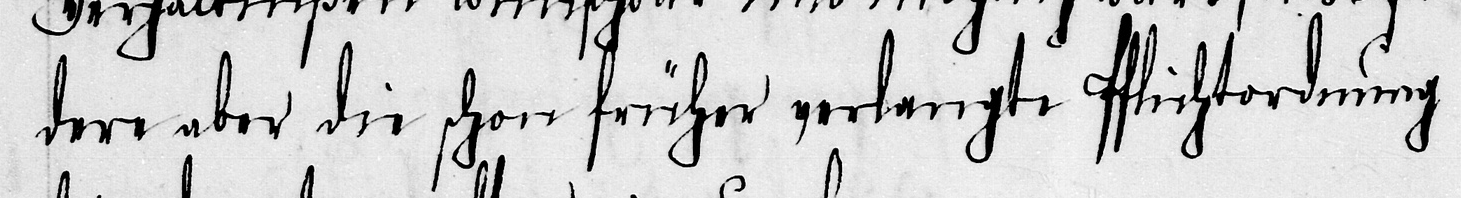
dere aber die schon früher verlangte Pflichtordnung
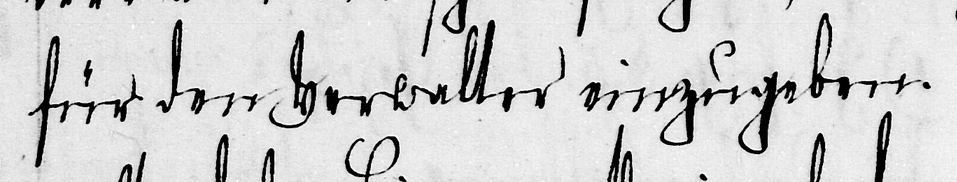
für den Verwalter einzugeben.
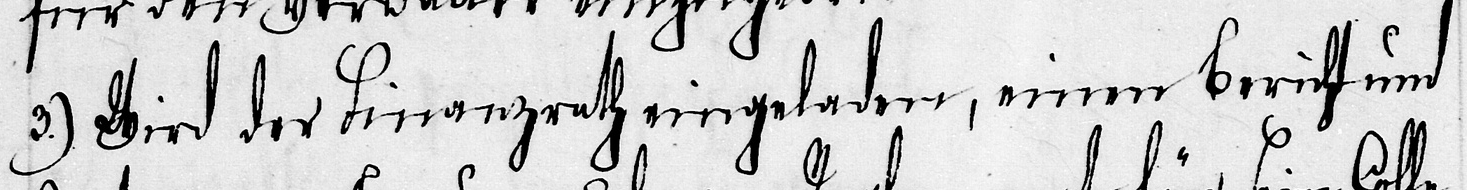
3.) Wird der Finanzrath eingeladen, einen Bericht und
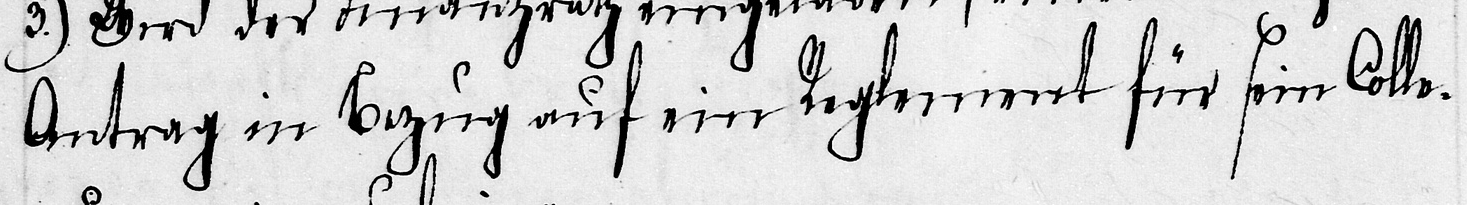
Antrag in Bezug auf ein Reglement für sein Coll¬
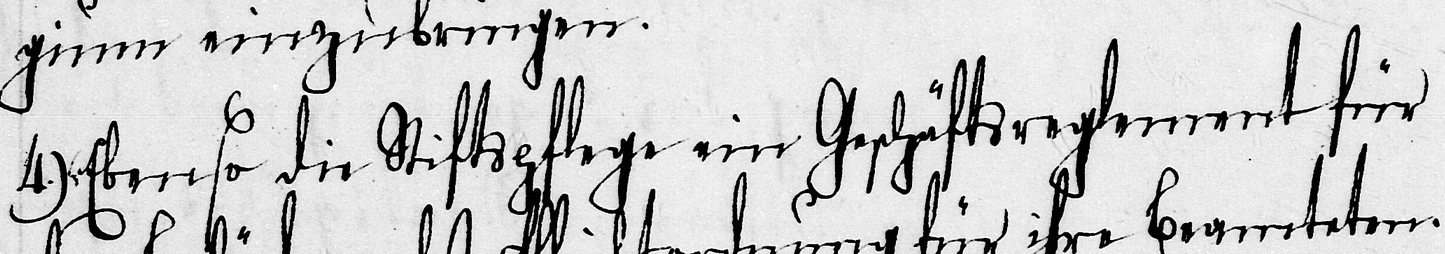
Ebenso die Stiftspflege ein Geschäftsreglement für
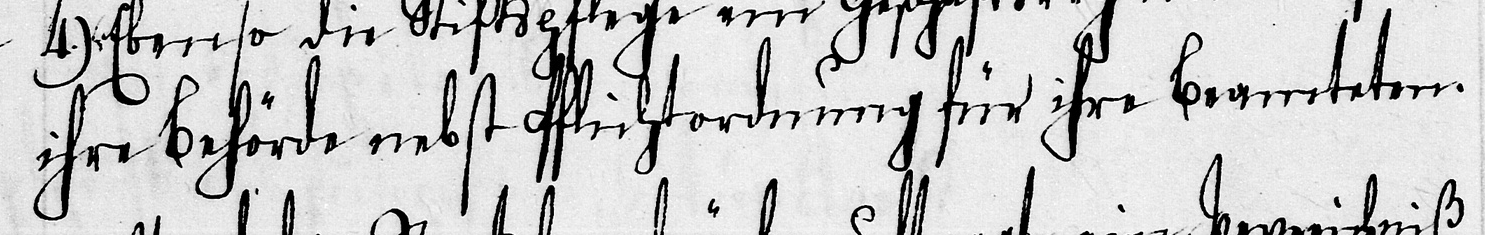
ihre Behörde nebst Pflichtordnung für ihre Beamteten.
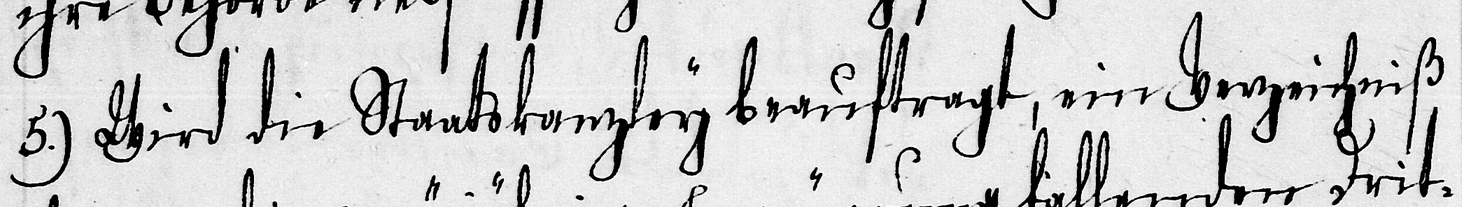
5.) Wird die Staatskanzley beauftragt, ein Verzeichniß
